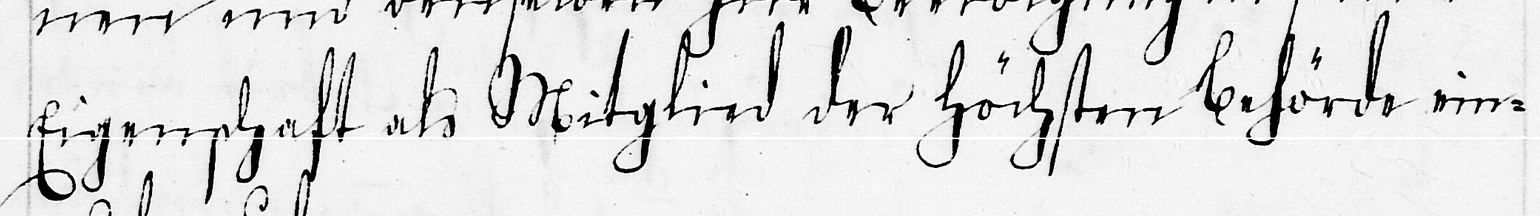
Eigenschaft als Mitglied der Höchsten Behörde ein¬
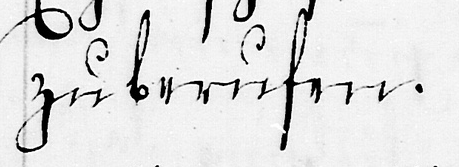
zuberufen.
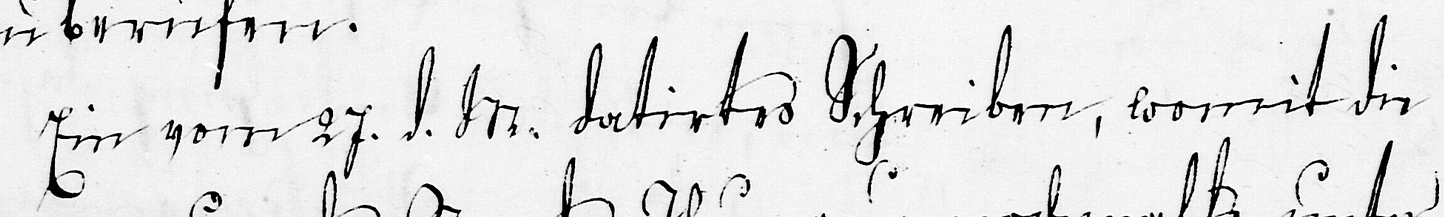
Ein vom 27. d. M. datirtes Schreiben, womit die
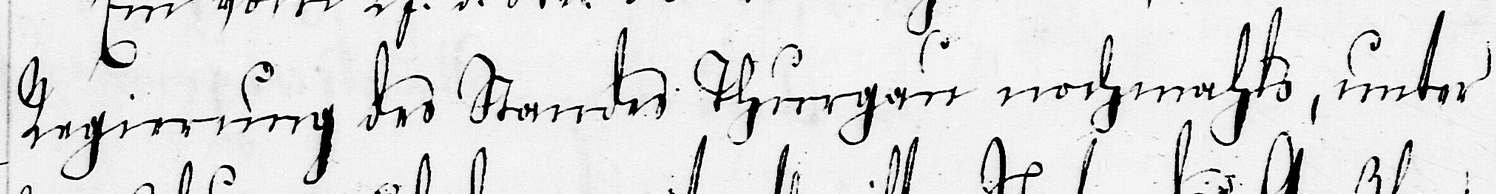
Regierung des Standes Thurgau nochmahls, unter
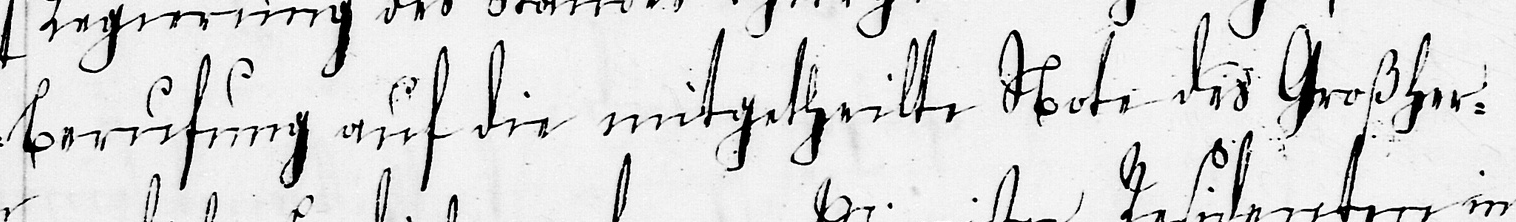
Berufung auf die mitgetheilte Note des Großher¬
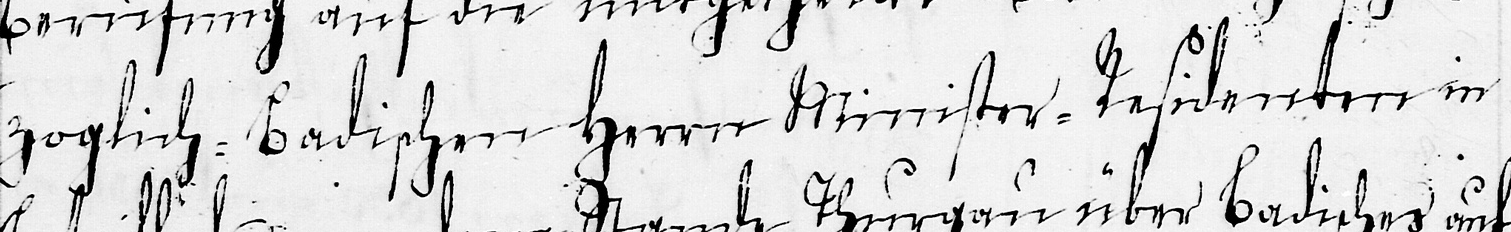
zoglich-Badischen Herrn Minister-Residenten in
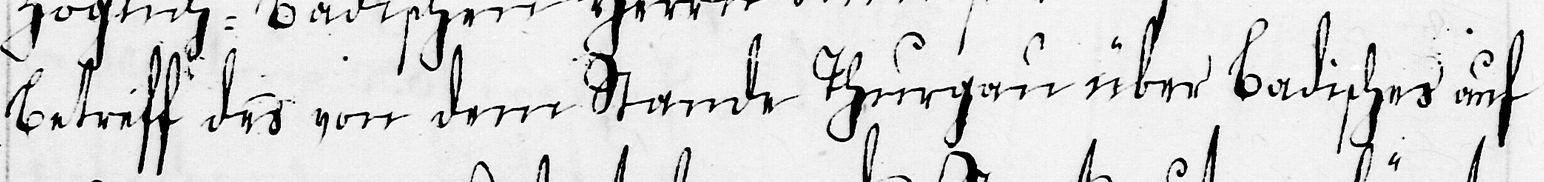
Betreff des von dem Stande Thurgau über Badisches auf
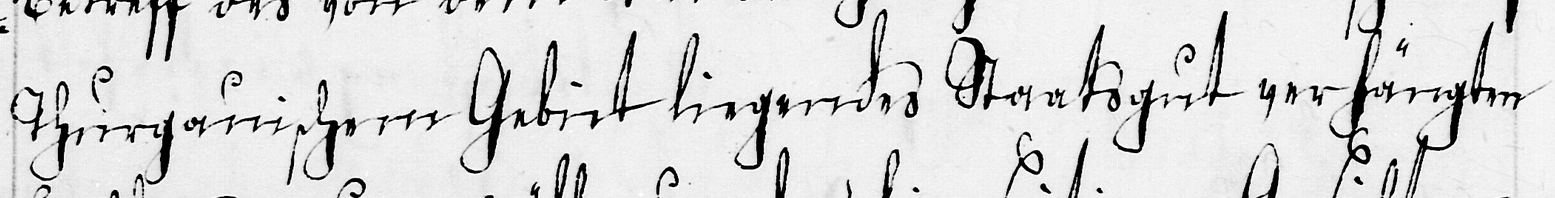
Thurgauischem Gebiet liegendes Staatsgut verhängten
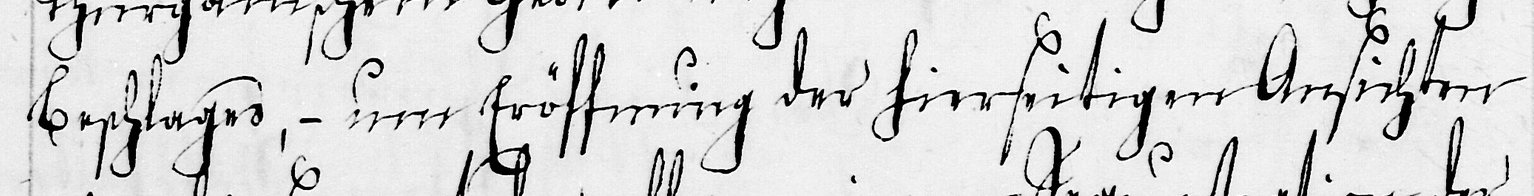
Beschlages, – um Eröffnung der hierseitigen Ansichten
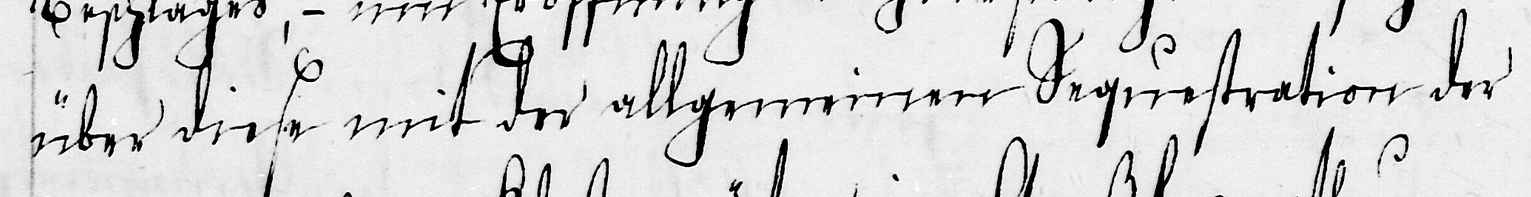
über diese mit der allgemeinen Sequestration der
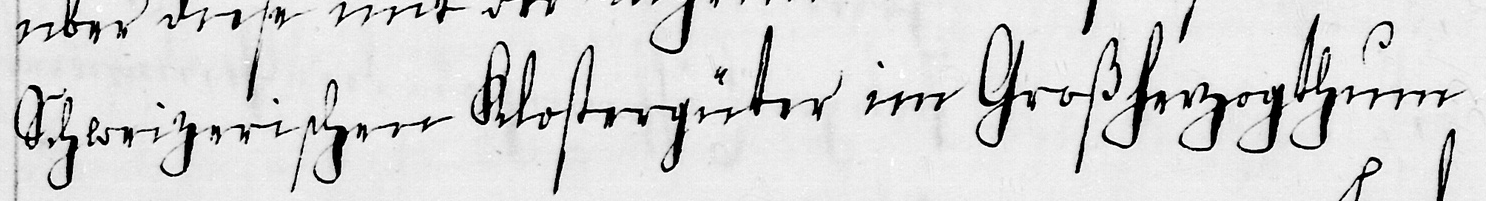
Schweizerischen Klostergüter im Großherzogthum
